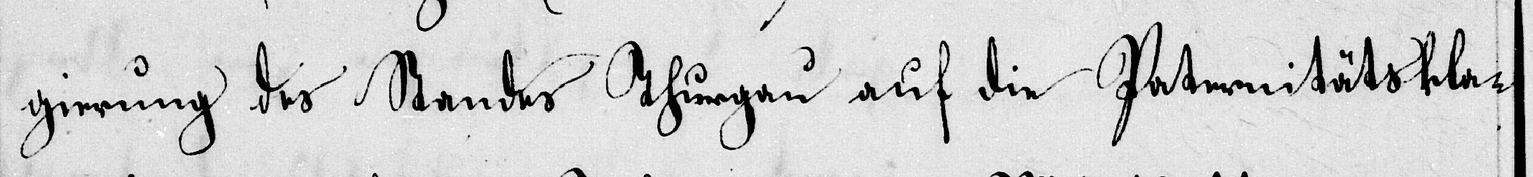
gierung des Standes Thurgau auf die Paternitätskla¬
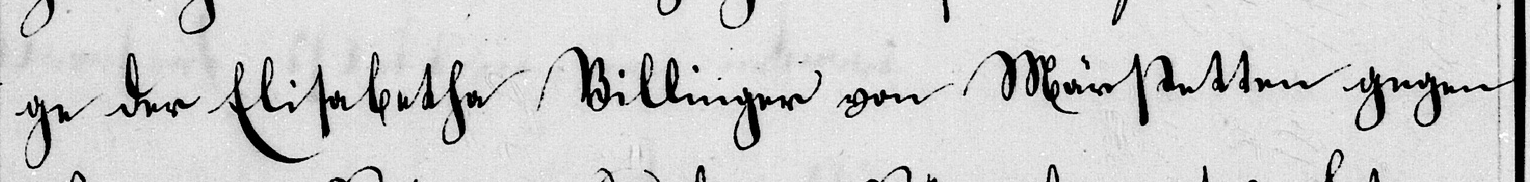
ge der Elisabetha Villinger von Märstetten gegen
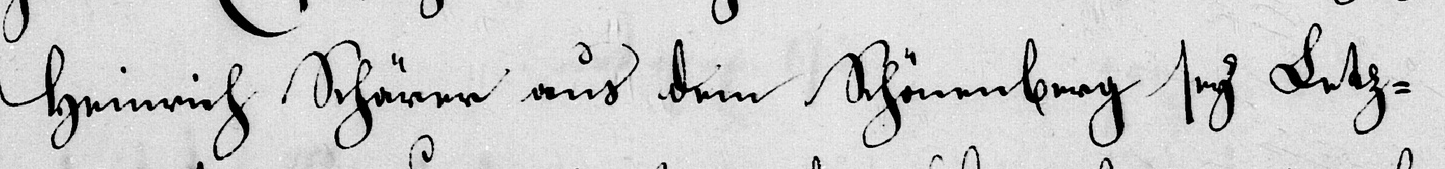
Heinrich Schärer aus dem Schönenberg sey Letz¬
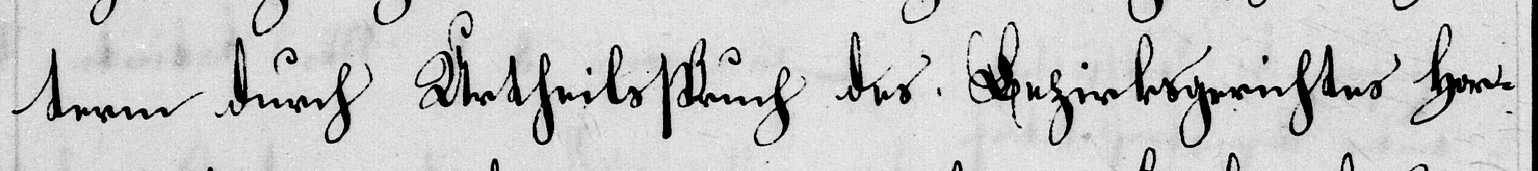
terem durch Urtheilsspruch des Bezirksgerichtes Hor¬
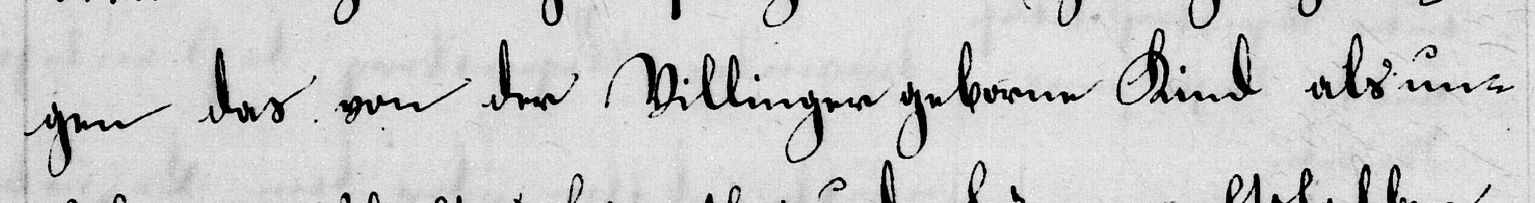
gen das von der Villinger geborene Kind als un¬
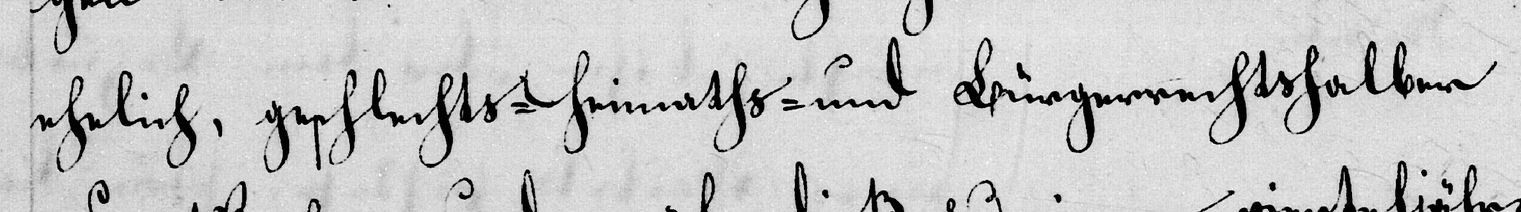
ehelich, geschlechts- heimaths- und Bürgerrechtshalber
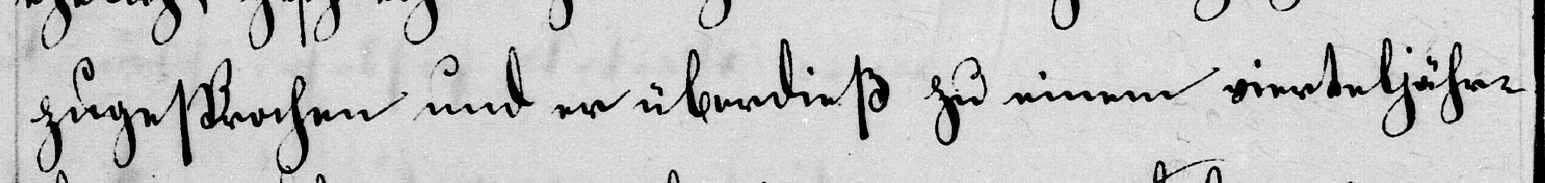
zugesprochen und er überdieß zu einem vierteljähr¬
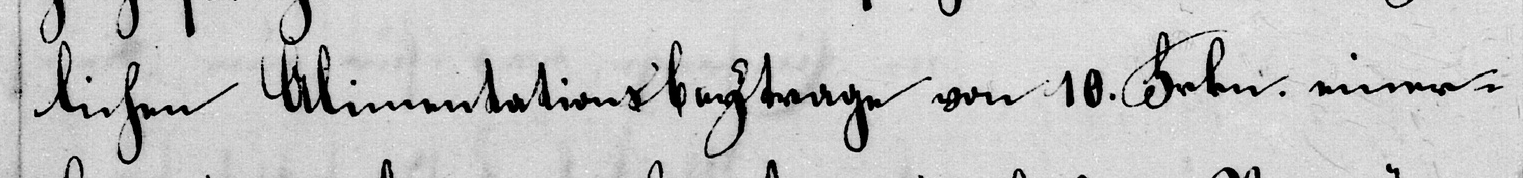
lichen Alimentationsbeytrage von 10. Frkn. einer¬
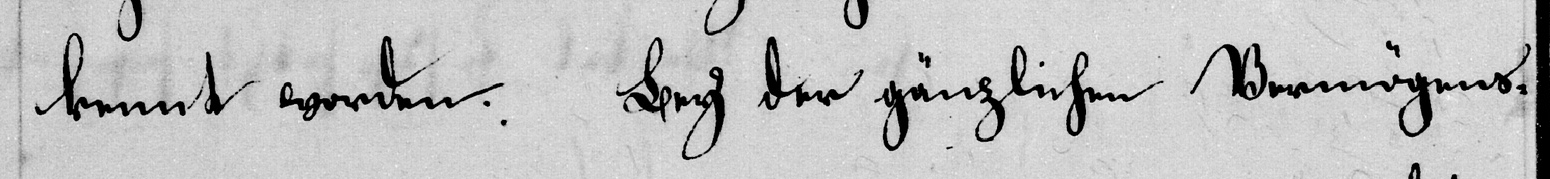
kennt worden. Bey der gänzlichen Vermögens-
